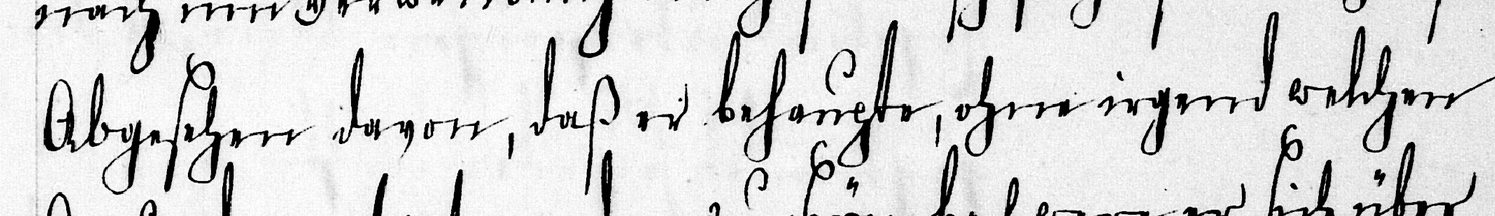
Abgesehen davon, daß er behaupte, ohne irgend welchen
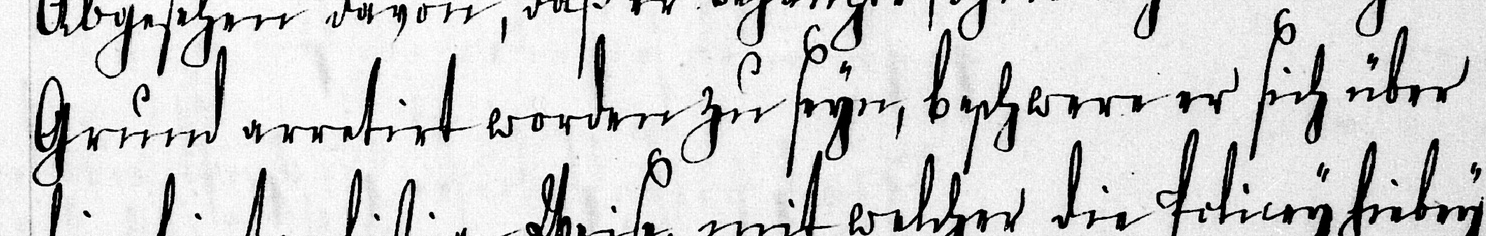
Grund arretirt worden zu seyn, beschwere er sich über
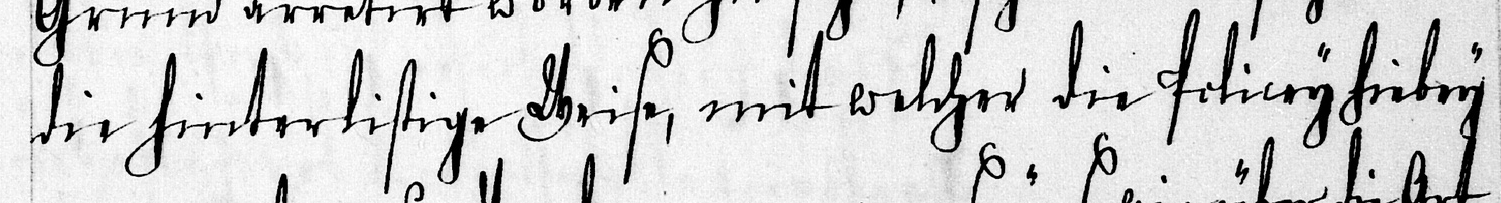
die hinterlistige Weise, mit welcher die Policey hiebey
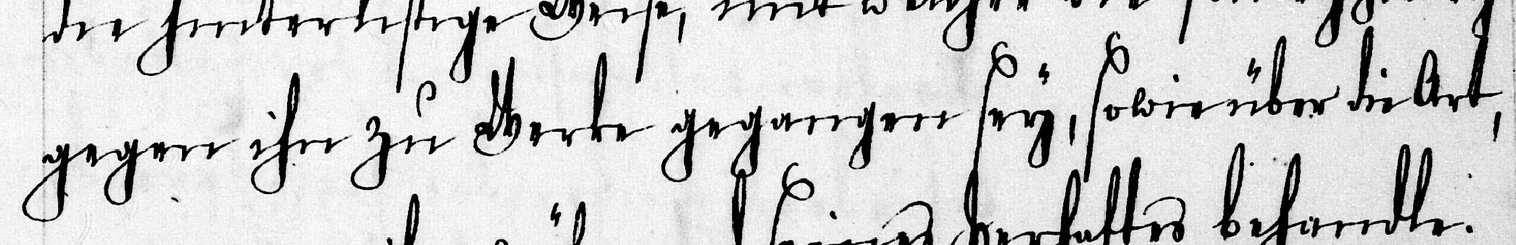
gegen ihn zu Werke gegangen sey, sowie über die Art,
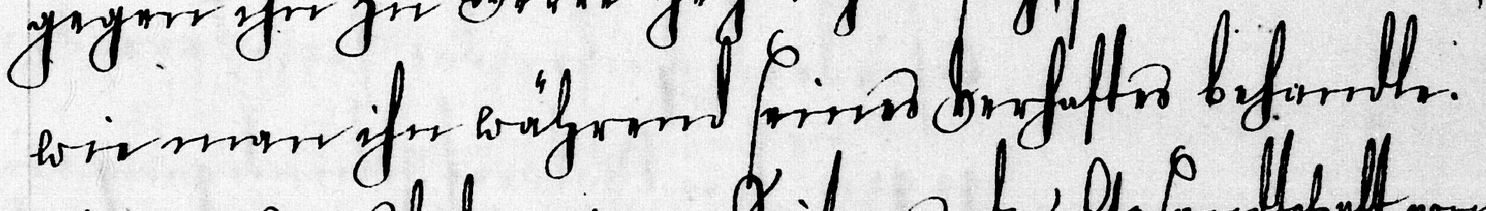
wie man ihn während seines Verhaftes behandle.
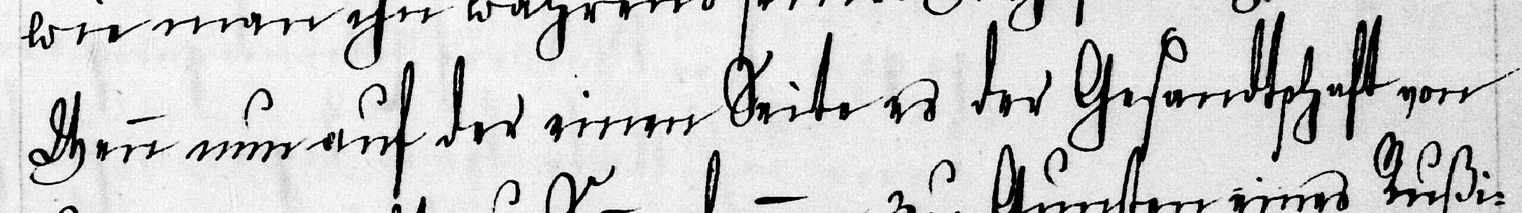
Wenn nun auf der einen Seite es der Gesandtschaft von
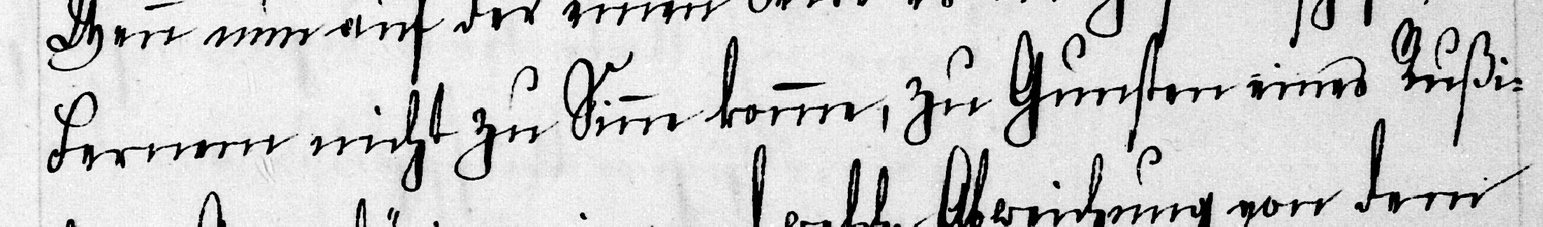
Fernem nicht zu Sinn komme, zu Gunsten eines Rußi¬
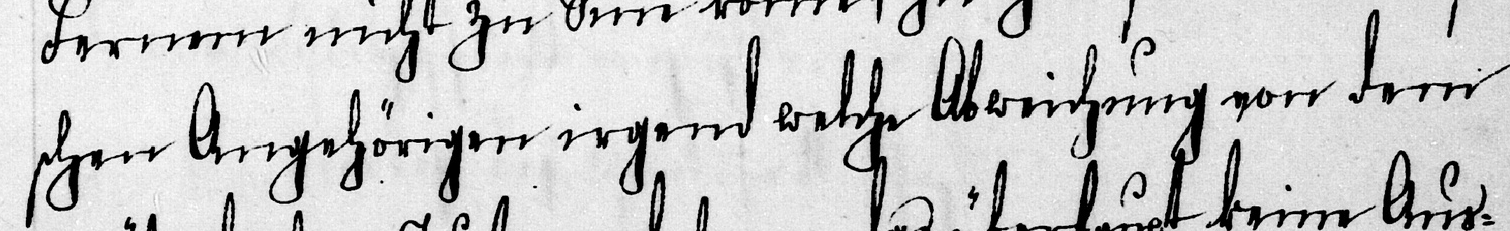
schen Angehörigen irgend welche Abweichung von dem
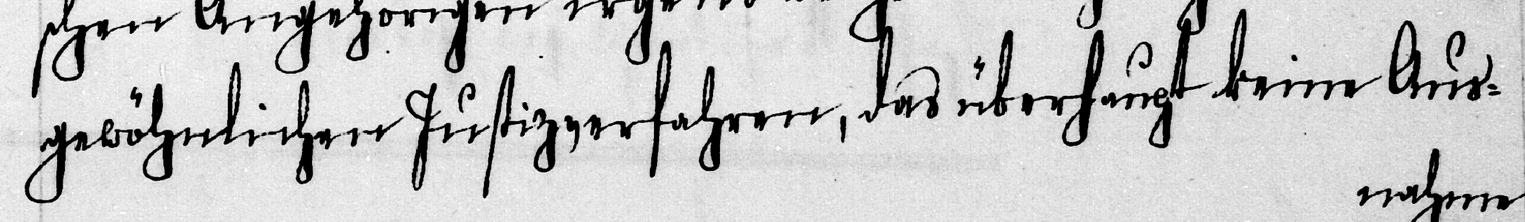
gewöhnlichen Justizverfahren, das überhaupt keine Aus-
